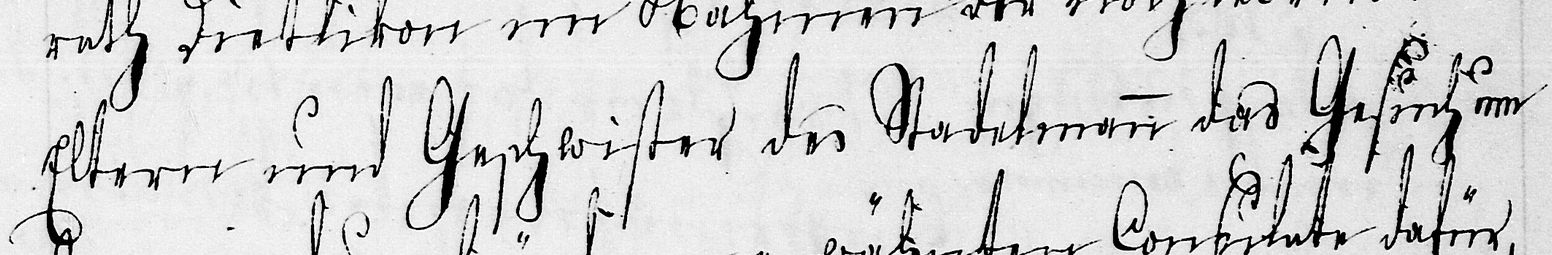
Eltern und Geschwister des Stadelmann das Gesuch um
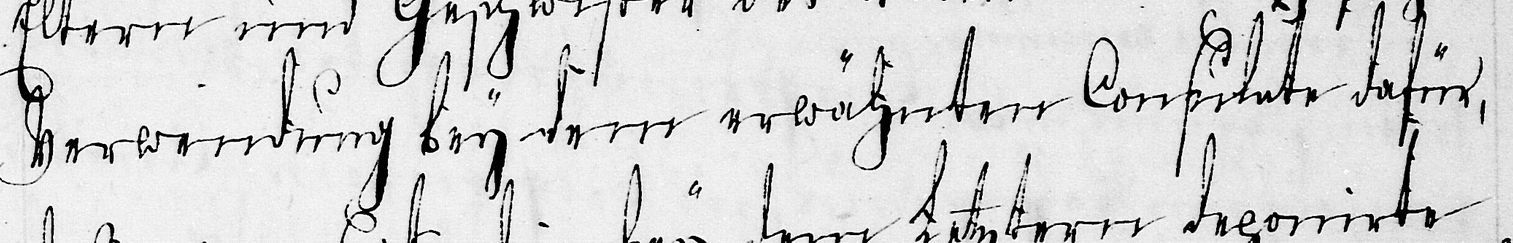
Verwendung bey dem erwähnten Consulate dafür,
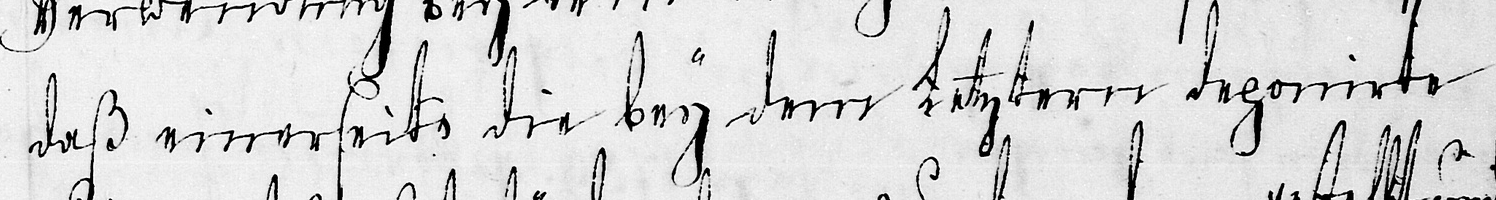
daß einerseits die bey dem Letztern deponirte
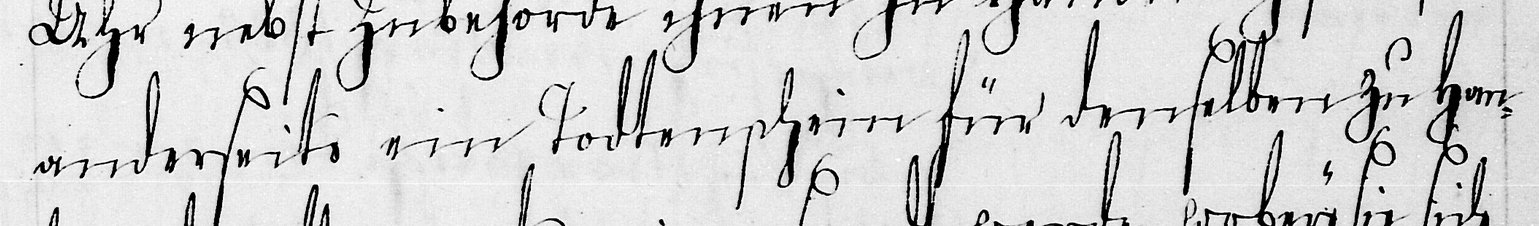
anderseits ein Todtenschein für denselben zu Han¬
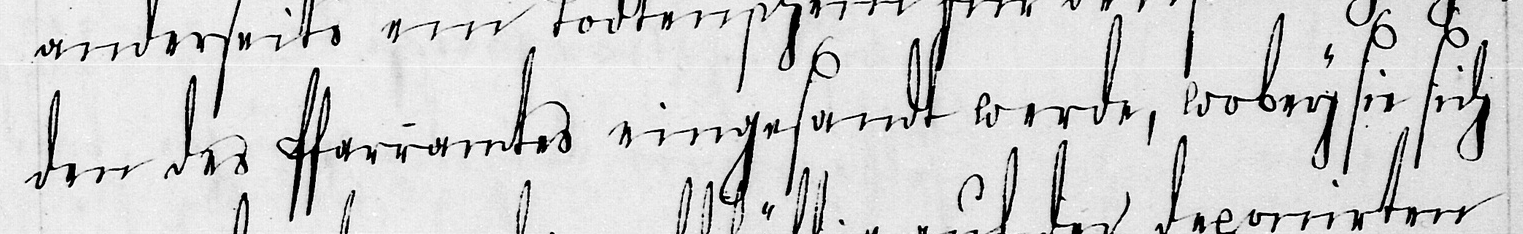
den des Pfarramtes eingesandt werde, wobey sie sich
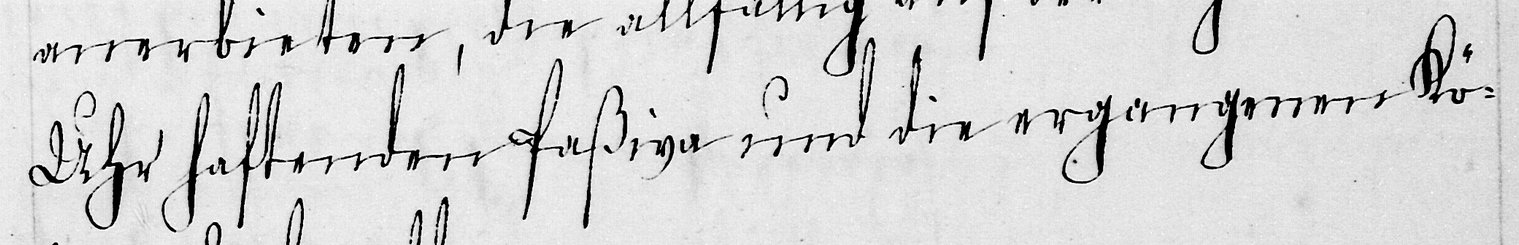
Uhr haftenden Paßiva und die ergangenen Kö¬
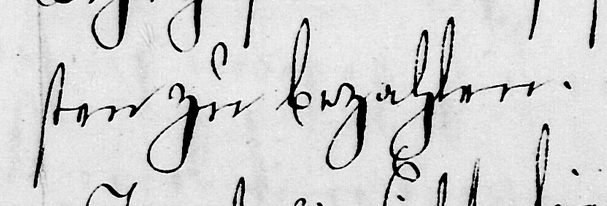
sten zu bezahlen.
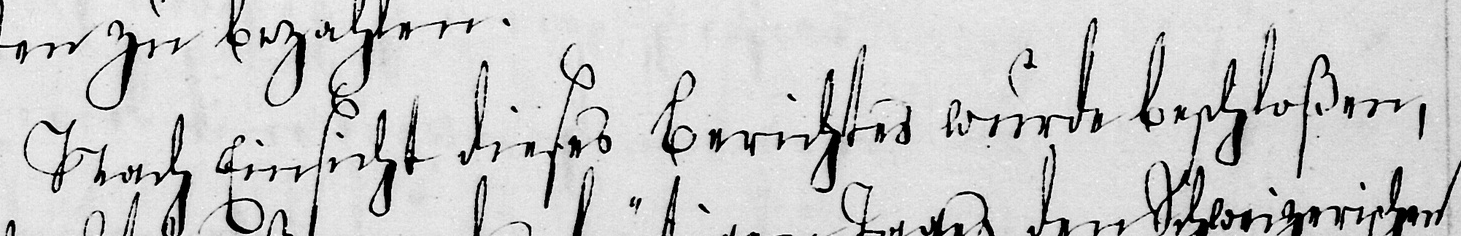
Nach Einsicht dieses Berichtes wurde beschloßen,
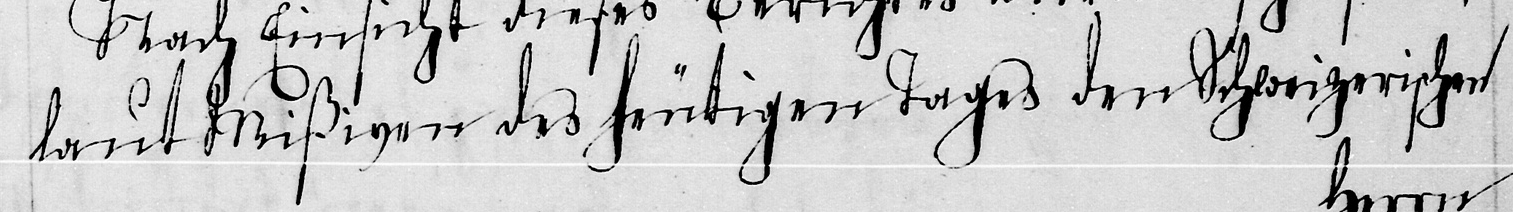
laut Mißiven des heutigen Tages den Schweizerischen
